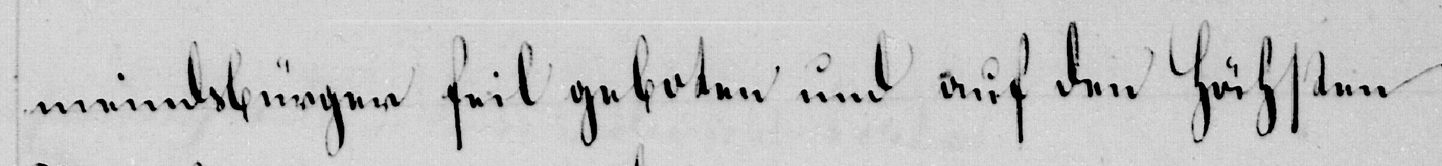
meindsbürger feil geboten und auf den höchsten
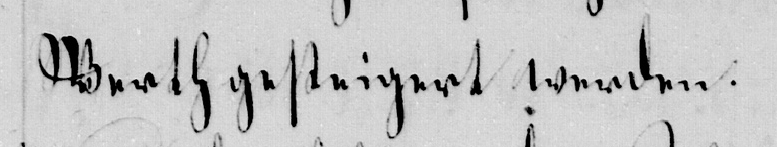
Werth gesteigert werden.
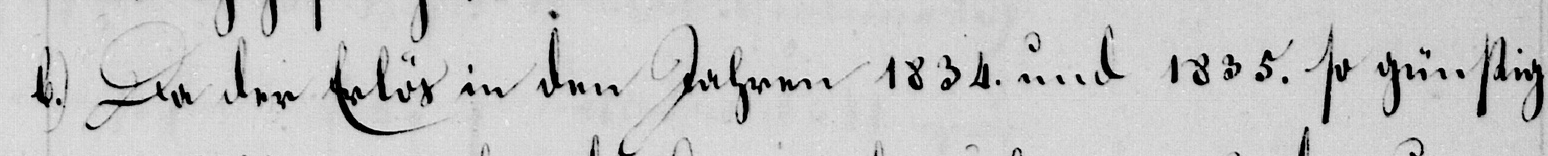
b.) Da der Erlös in den Jahren 1834. und 1835. so günstig
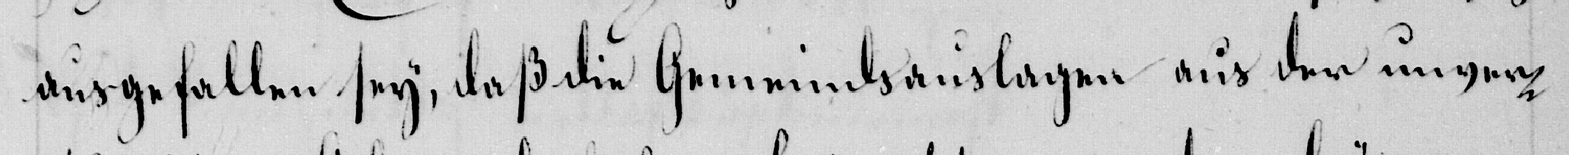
ausgefallen sey, daß die Gemeindsauslagen aus der unge¬
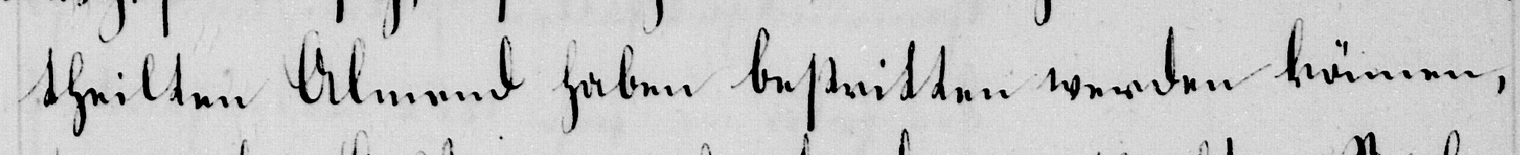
theilten Almend haben bestritten werden können,
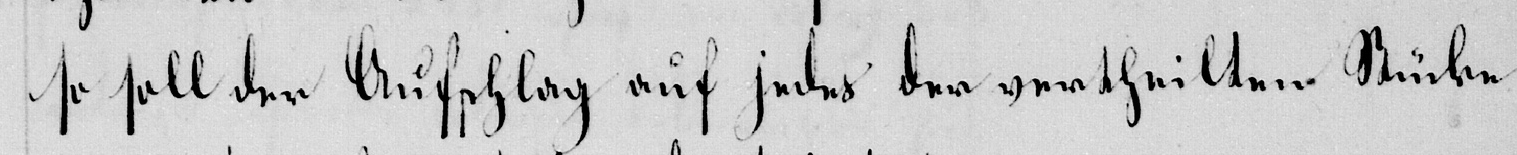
so soll der Aufschlag auf jedes der vertheilten Stücke
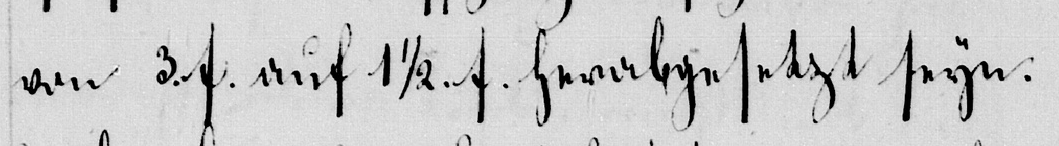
von 3. f. auf 1 ½. f. herabgesetzt seyn.
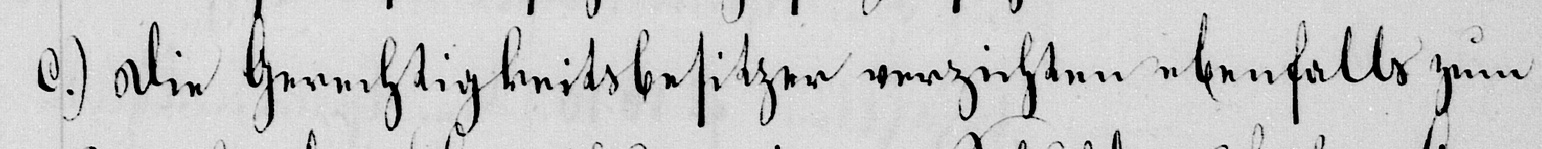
c.) Die Gerechtigkeitsbesitzer verzichten ebenfalls zum
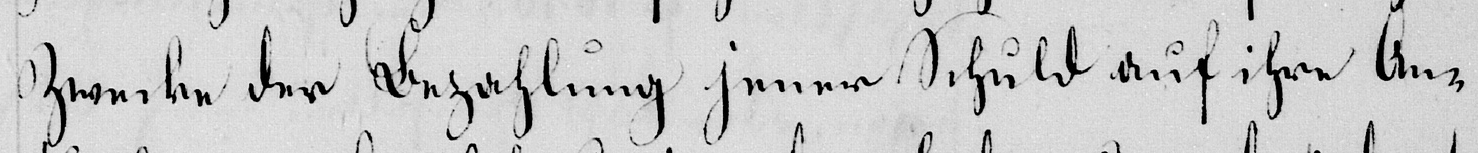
Zwecke der Bezahlung jener Schuld auf ihre An¬
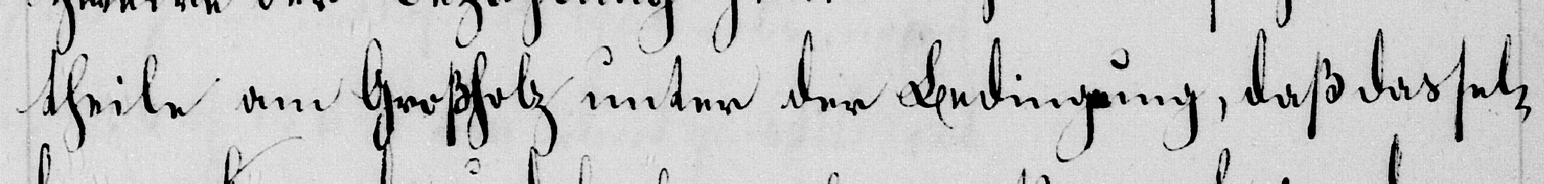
theile am Großholz unter der Bedingung, daß das sel¬
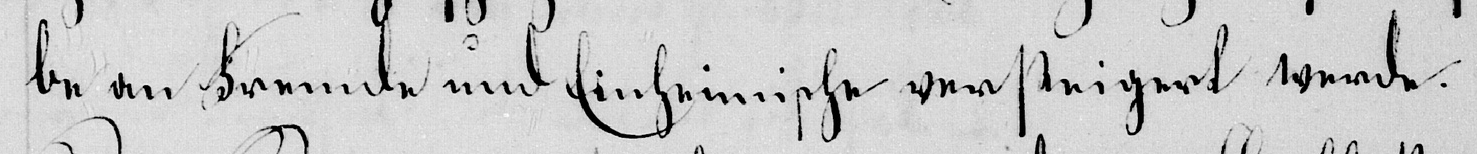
be an Fremde und Einheimische versteigert werde.
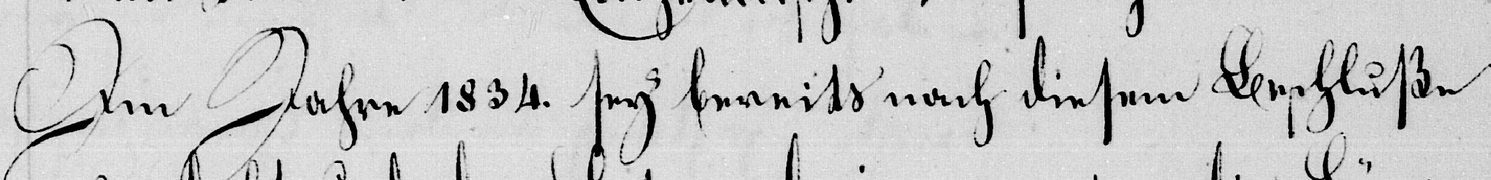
Im Jahre 1834. sey bereits nach diesem Beschluße
